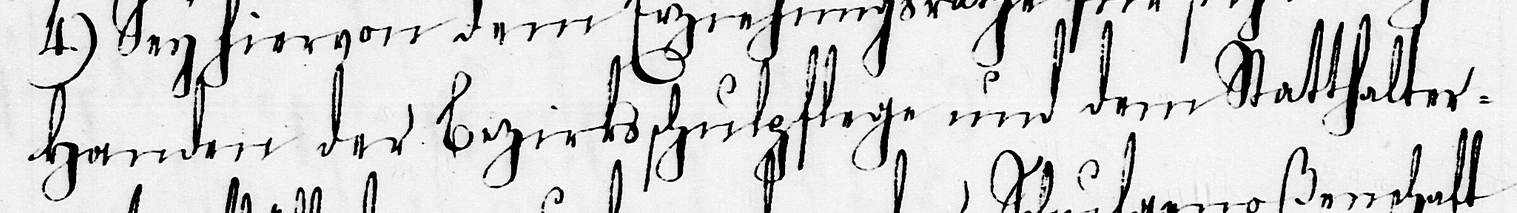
Handen der Bezirksschulpflege und dem Statthalter¬
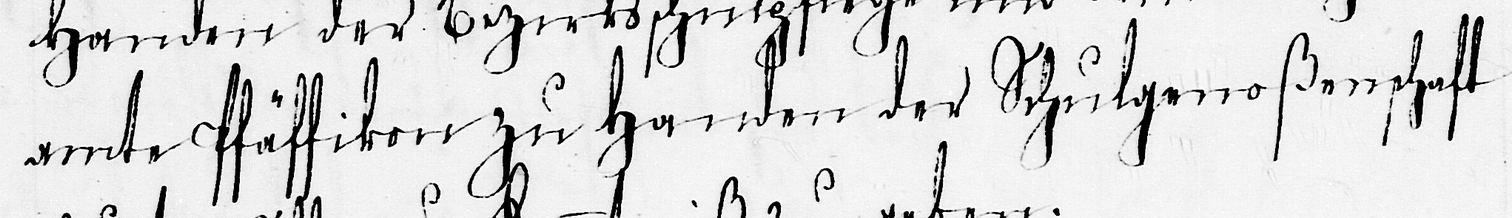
amte Pfäffikon zu Handen der Schulgenoßenschaft
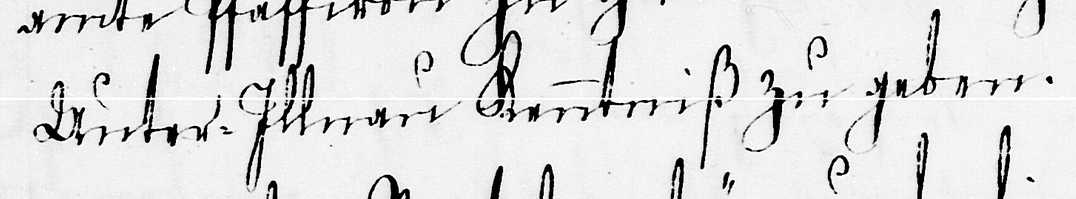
Unter-Illnau Kenntniß zu geben.
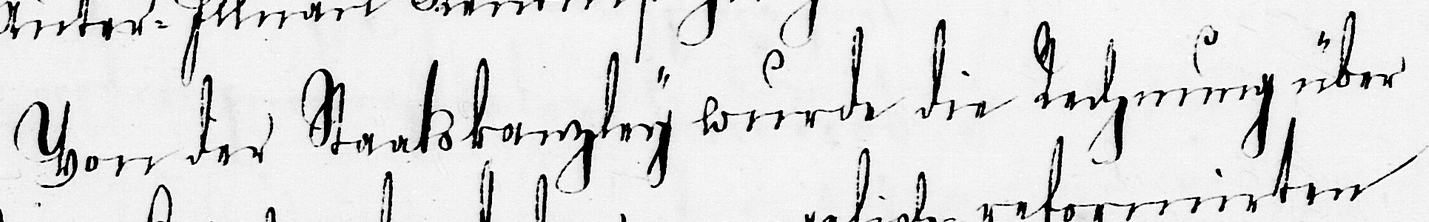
Von der Staatskanzley wurde die Rechnung über
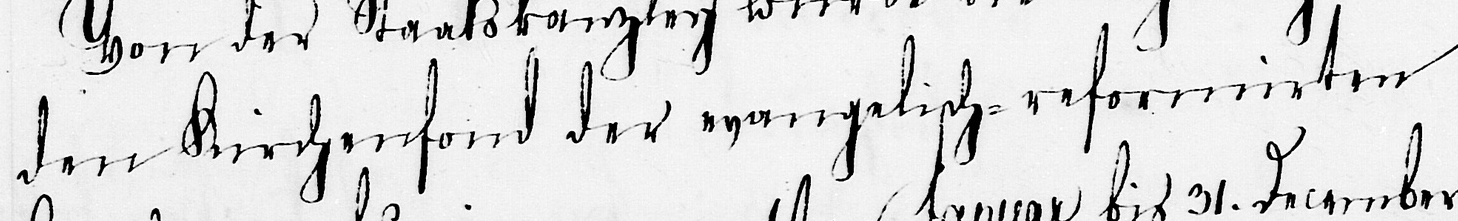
den Kirchenfond der evangelisch-reformirten
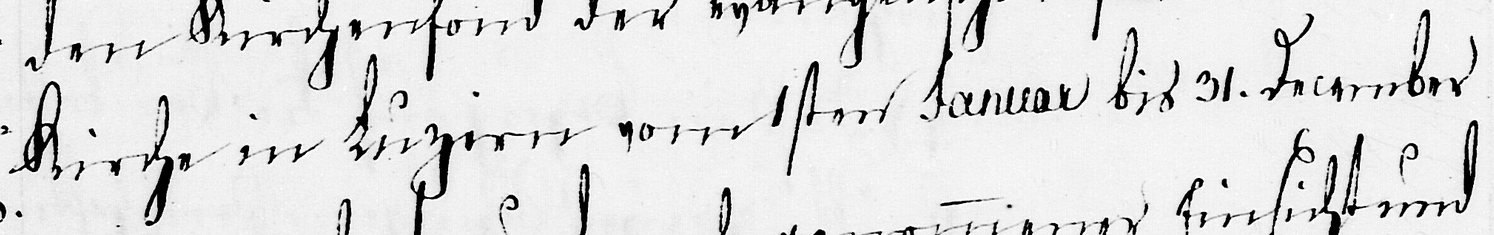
Kirche in Luzern vom 1sten Januar bis 31. December
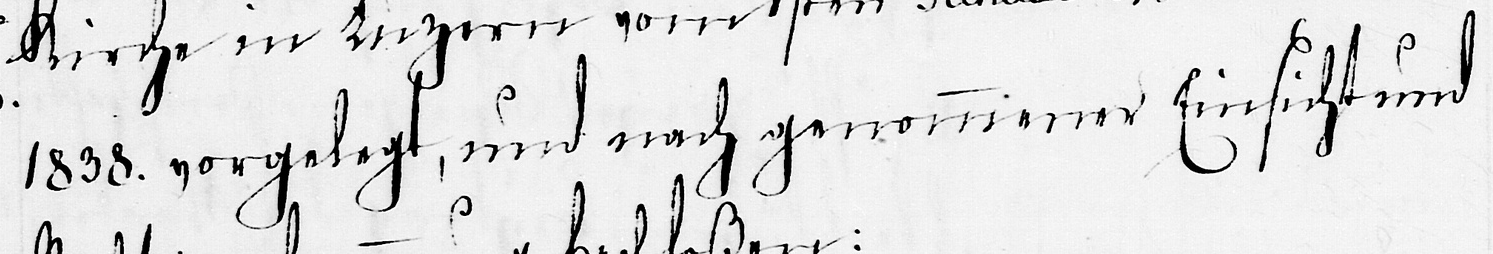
1838. vorgelegt, und nach genommener Einsicht und
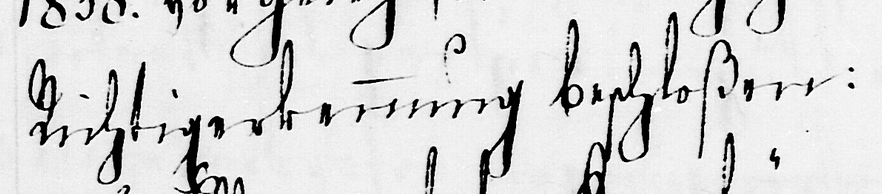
Richtigerkennung beschloßen:
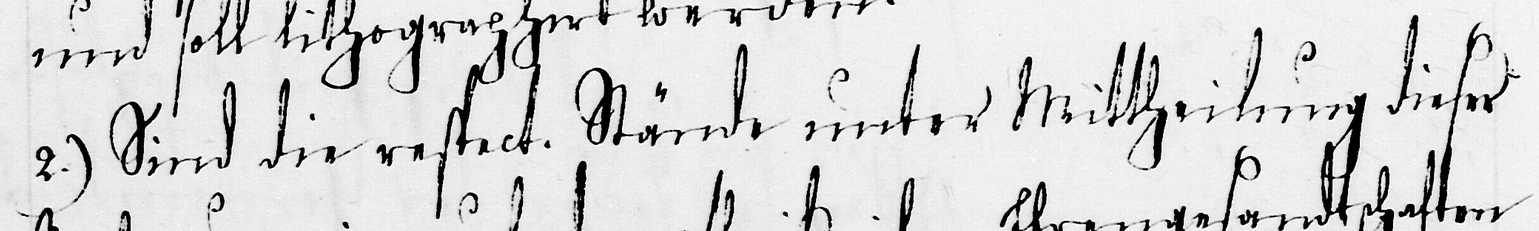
2.) Sind die respect. Stände unter Mittheilung dieser
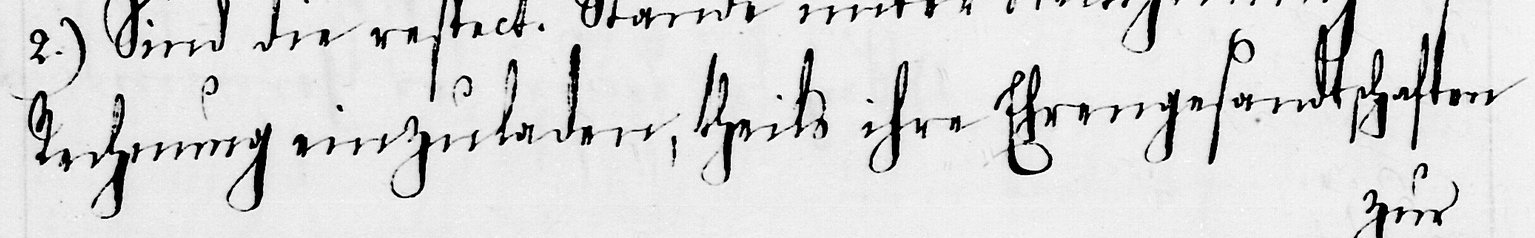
Rechnung einzuladen, theils ihre Ehrengesandtschaften
